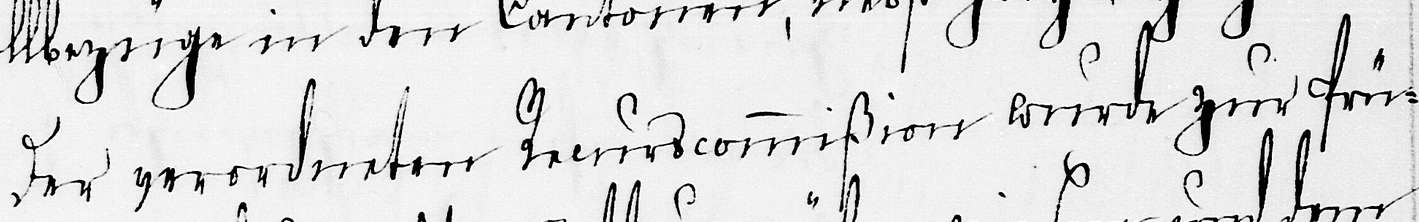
Der verordneten Recurscommißion wurde zur Prü¬
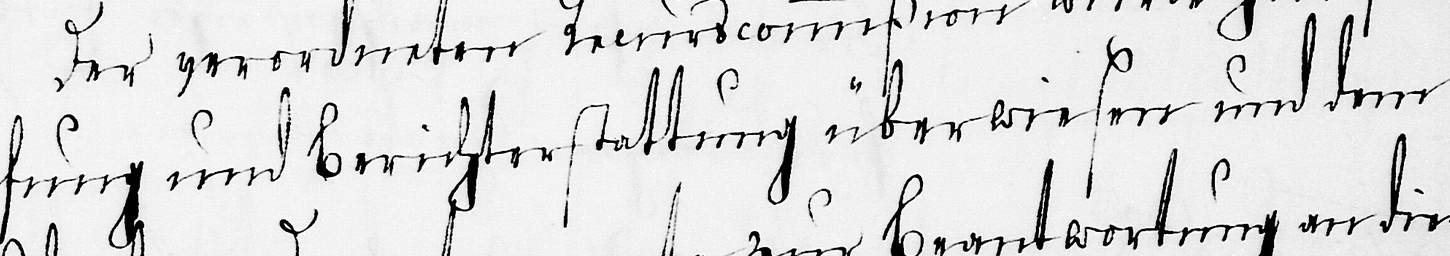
fung und Berichterstattung überwiesen und dem
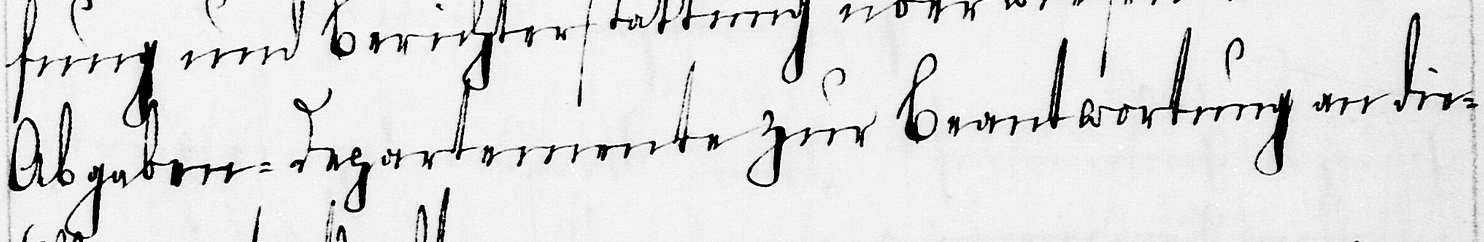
Abgaben-Departemente zur Beantwortung an die¬
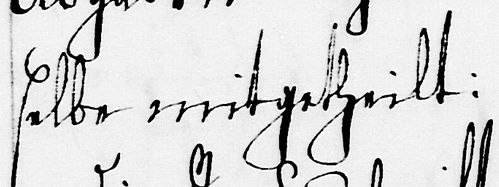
selbe mitgetheilt:
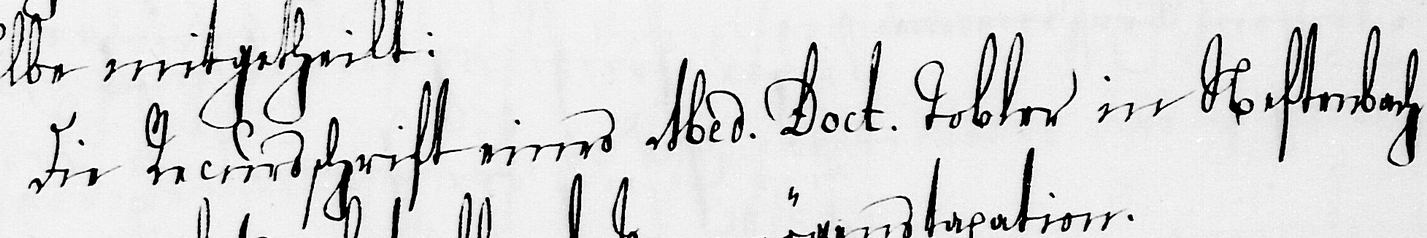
Die Recursschrift eines Med. Doct. Tobler in Neftenbach
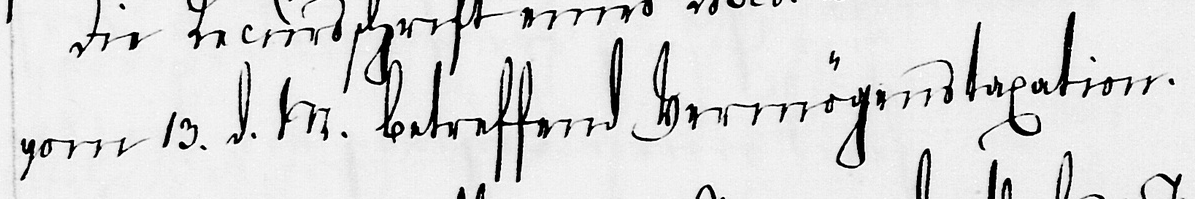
vom 13. d. M. betreffend Vermögenstaxation.
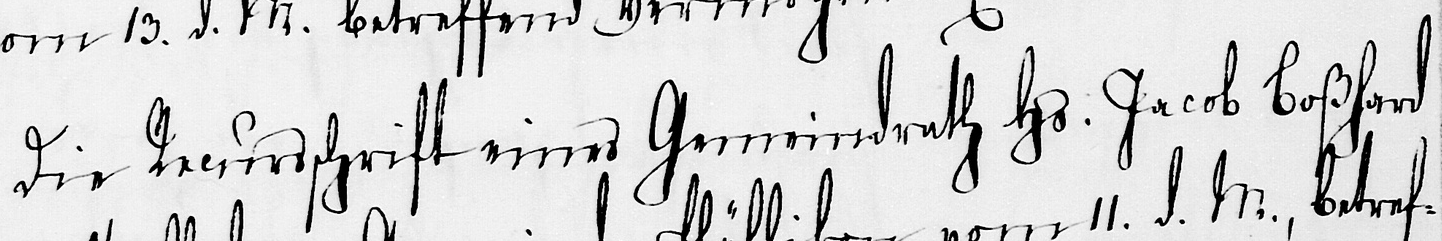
Die Recursschrift eines Gemeindrath Hs. Jacob Boßhard
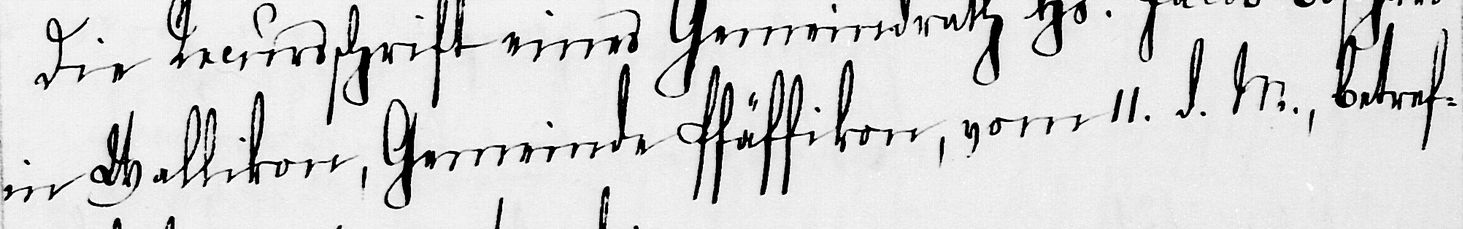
in Wallikon, Gemeinde Pfäffikon, vom 11. d. M.,
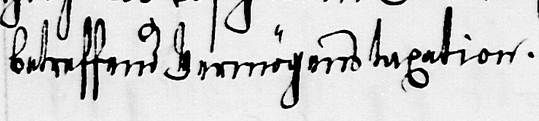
betreffend Vermögenstaxation.
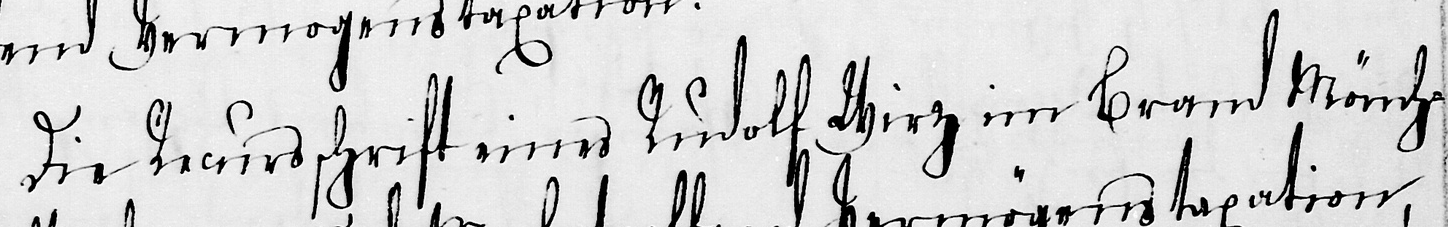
Die Recursschrift eines Rudolf Wirz im Brand Mönch¬
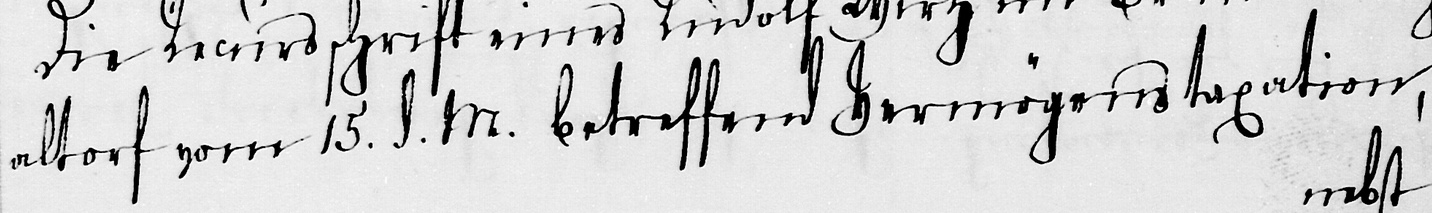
altorf vom 15. d. M. betreffend Vermögenstaxation,
